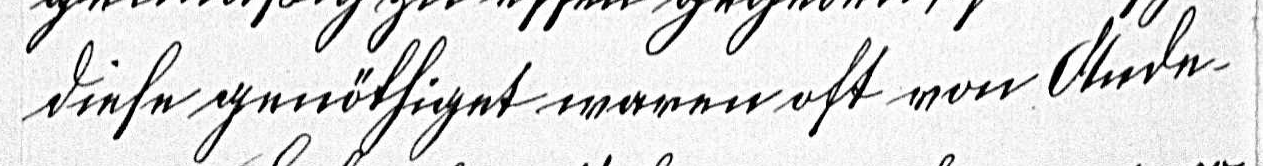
diese genöthiget waren oft von Ande¬
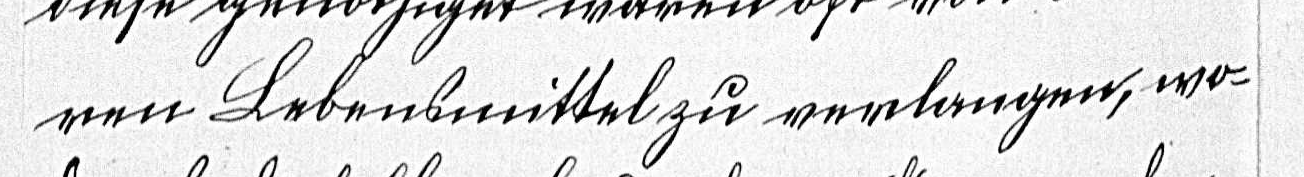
ren Lebensmittel zu verlangen, wo¬
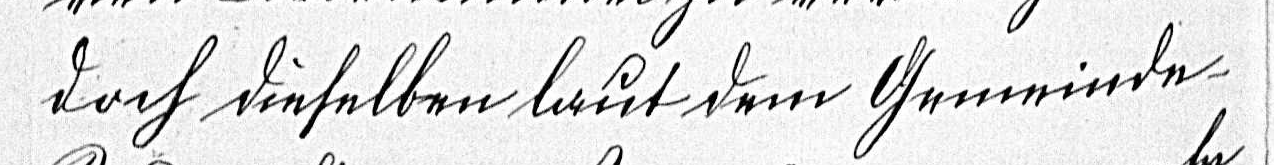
doch dieselben laut dem Gemeinde¬
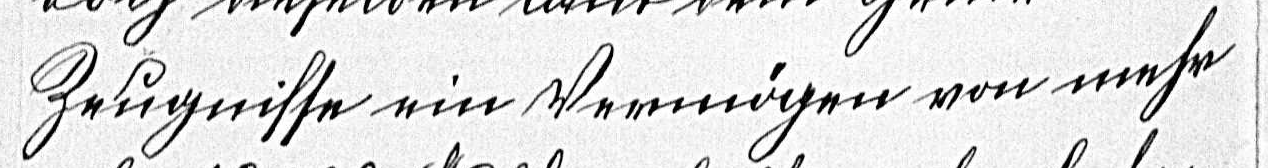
Zeugnisse ein Vermögen von mehr
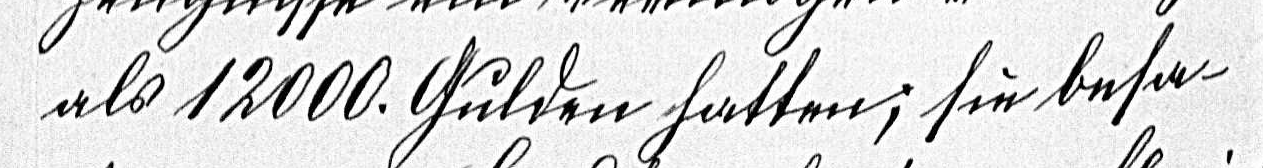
als 12000 Gulden hatten, sie besa¬
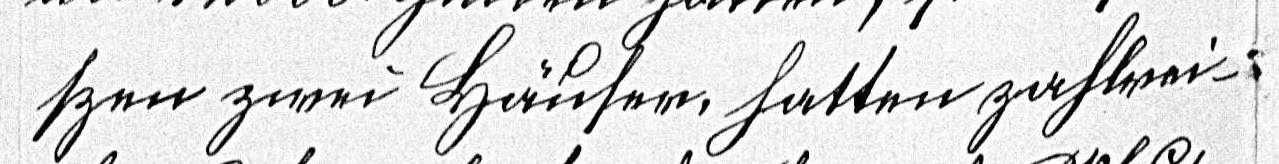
ßen zwei Häuser, hatten zahlrei¬
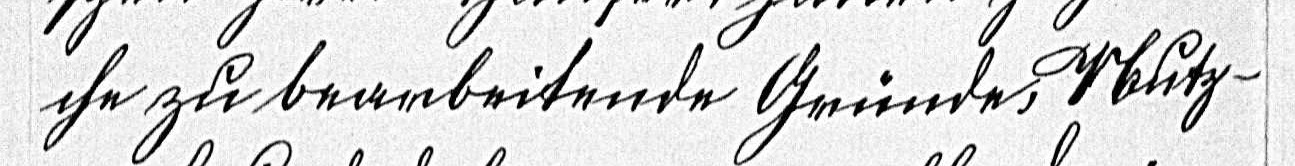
che zu bearbeitende Gründe, Nutz¬
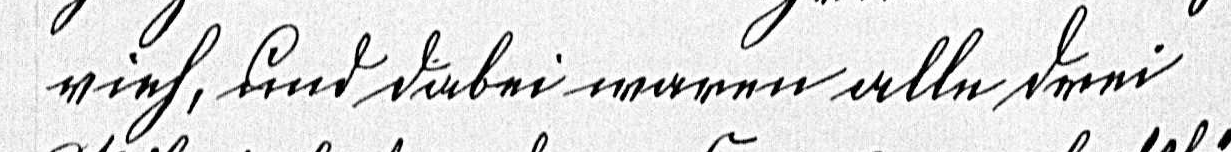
vieh, und dabei waren alle drei
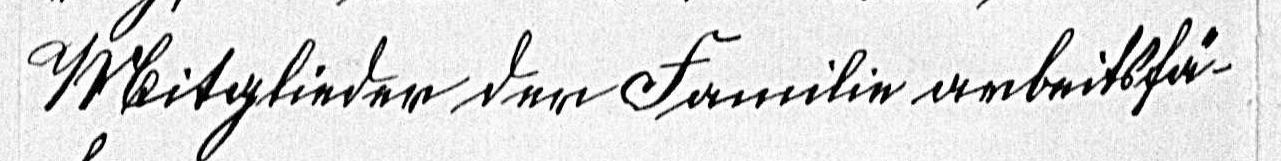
Mitglieder der Familie arbeitsfä¬
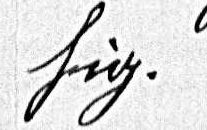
hig.
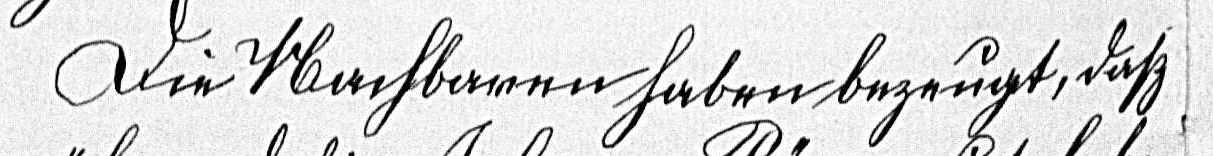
Die Nachbaren haben bezeugt, daß
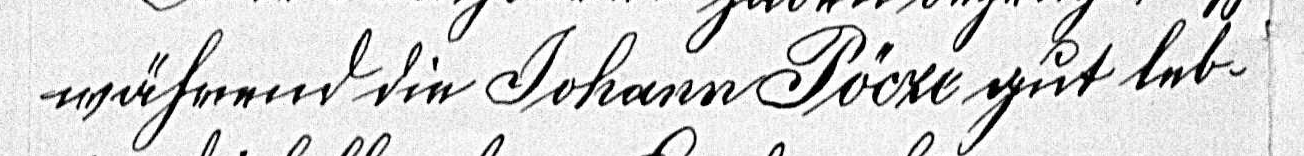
während die Johann Pöcze gut leb¬
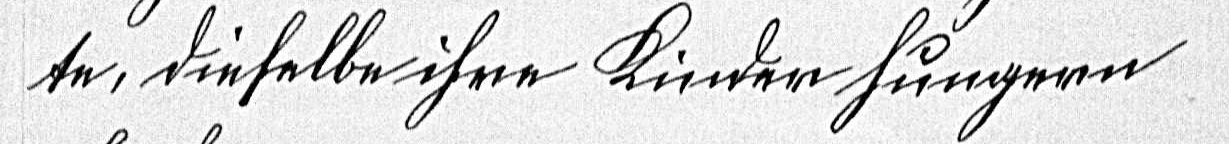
te, dieselbe ihre Kinder hungern
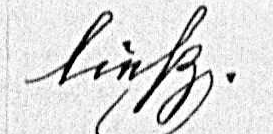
ließ.
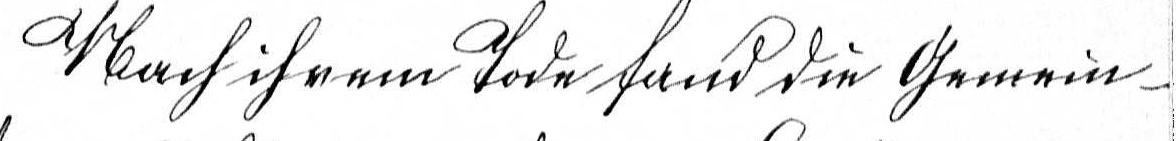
Nach ihrem Tode fand die Gemein¬
